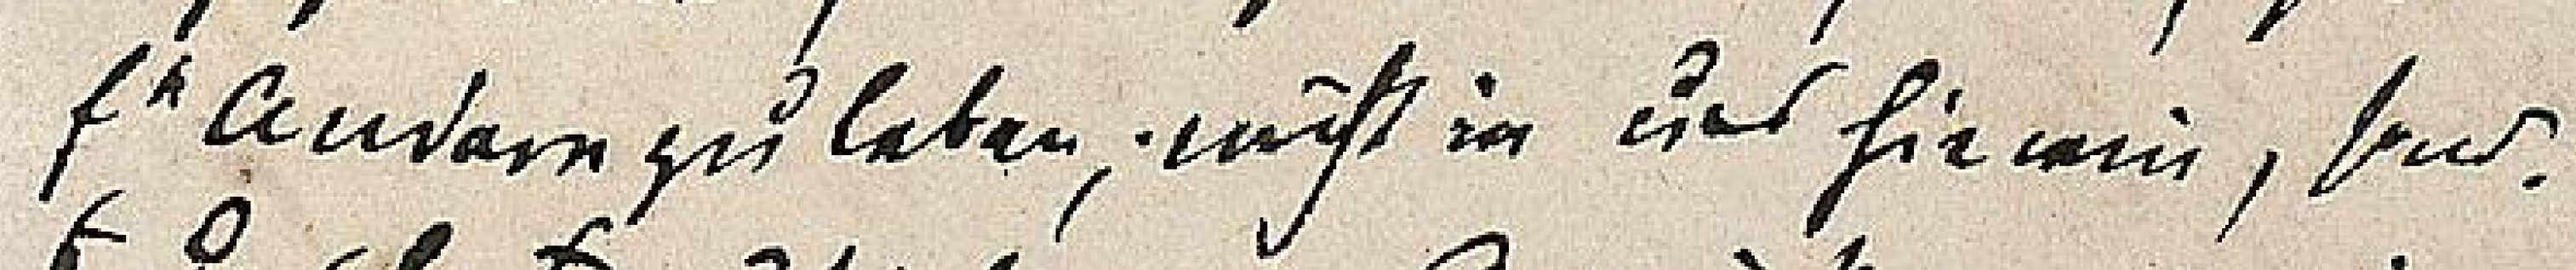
fü andere zu leben, nicht in uns hinein, sond.
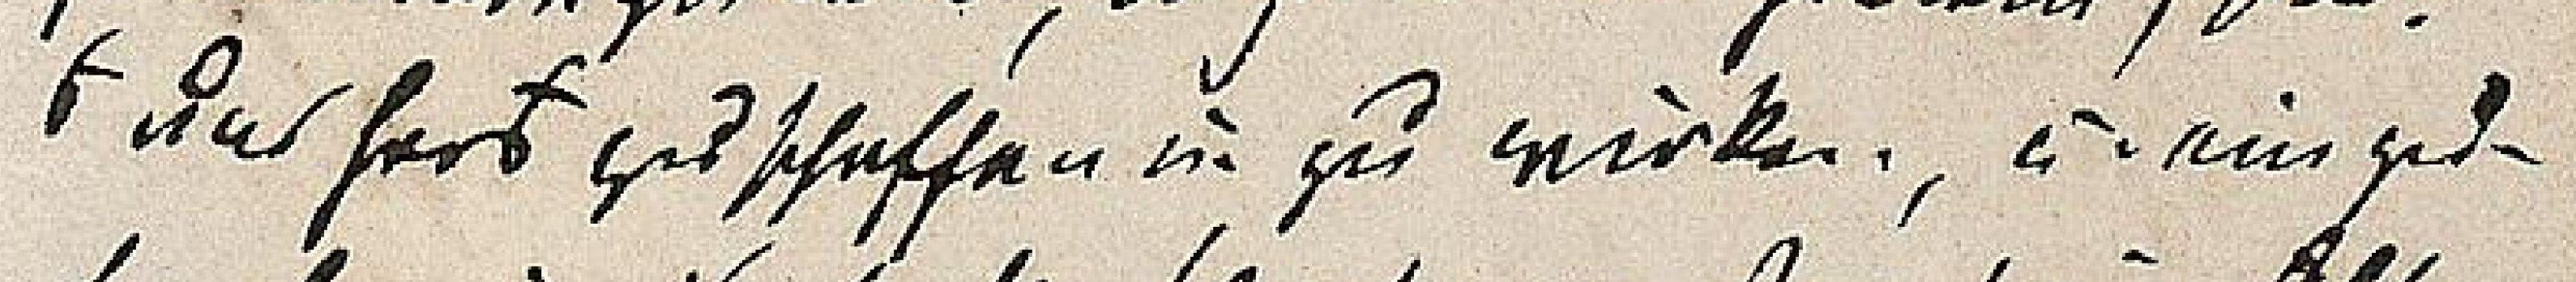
s uns hers zuschaffen u. zu wirken, u. einzu¬
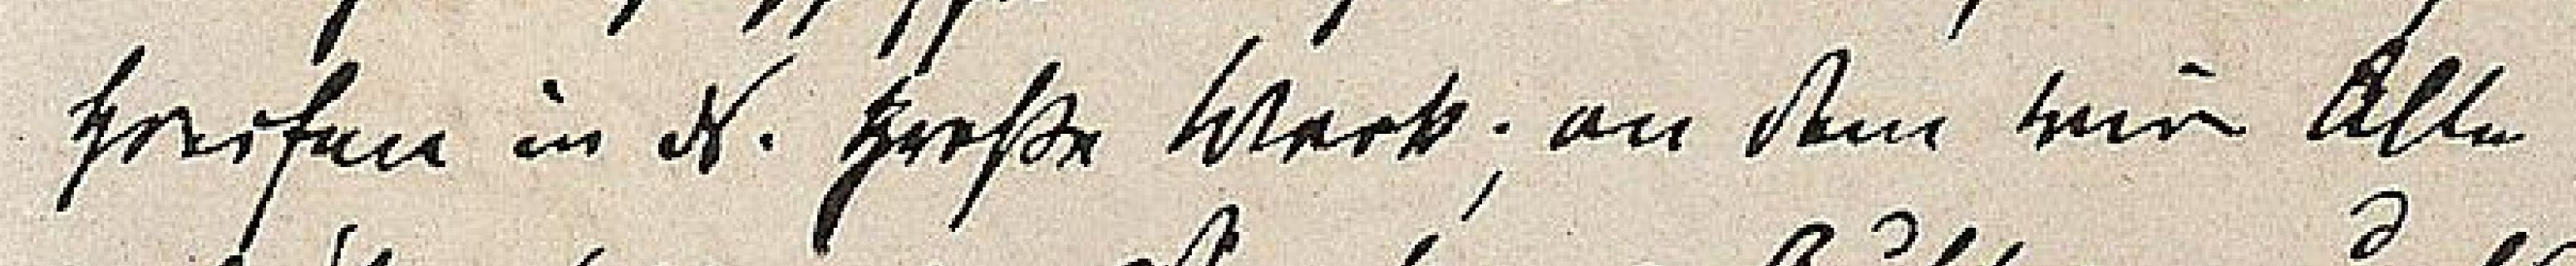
greifen in ds. große Werk., an dem wir Alle
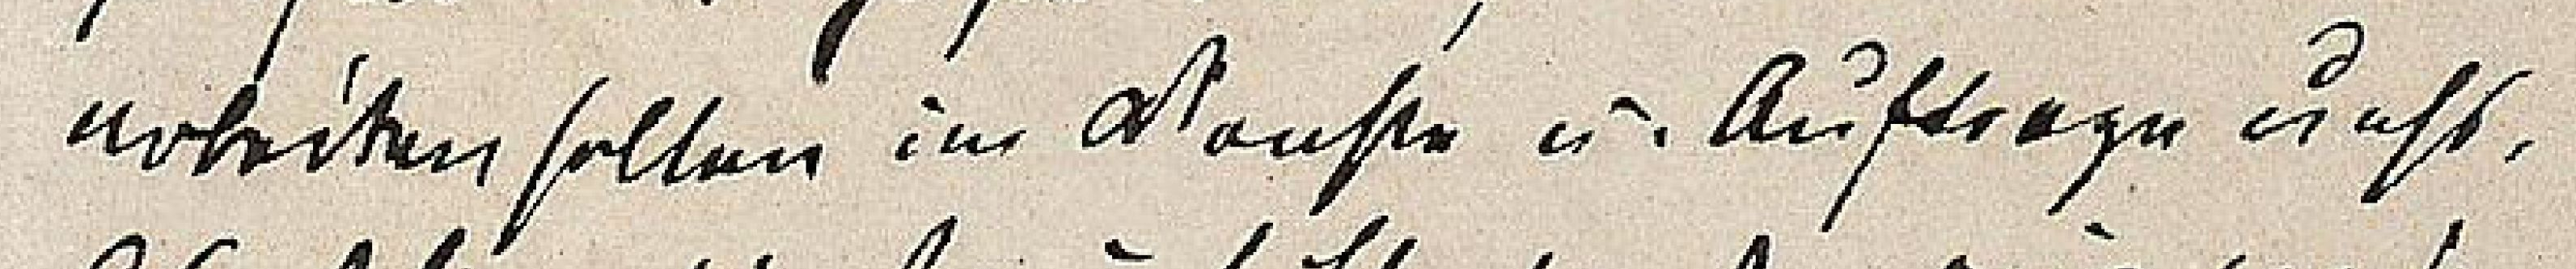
arbeiten sollen im Dienste u. Auftrage unss.
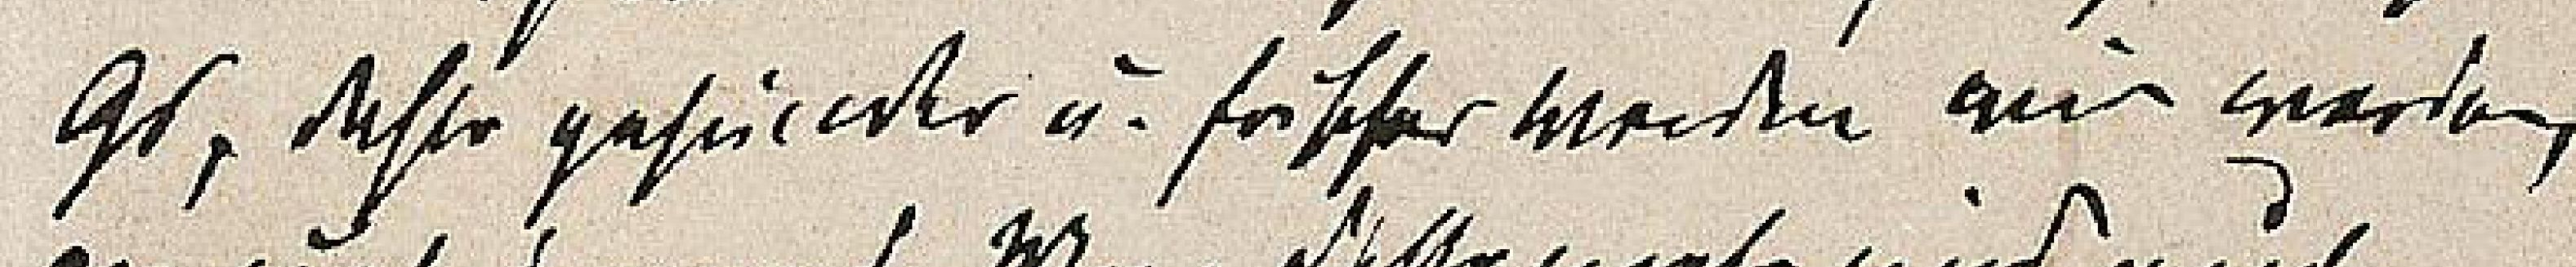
Gs., desto gesünder u. frischer werden wir werden
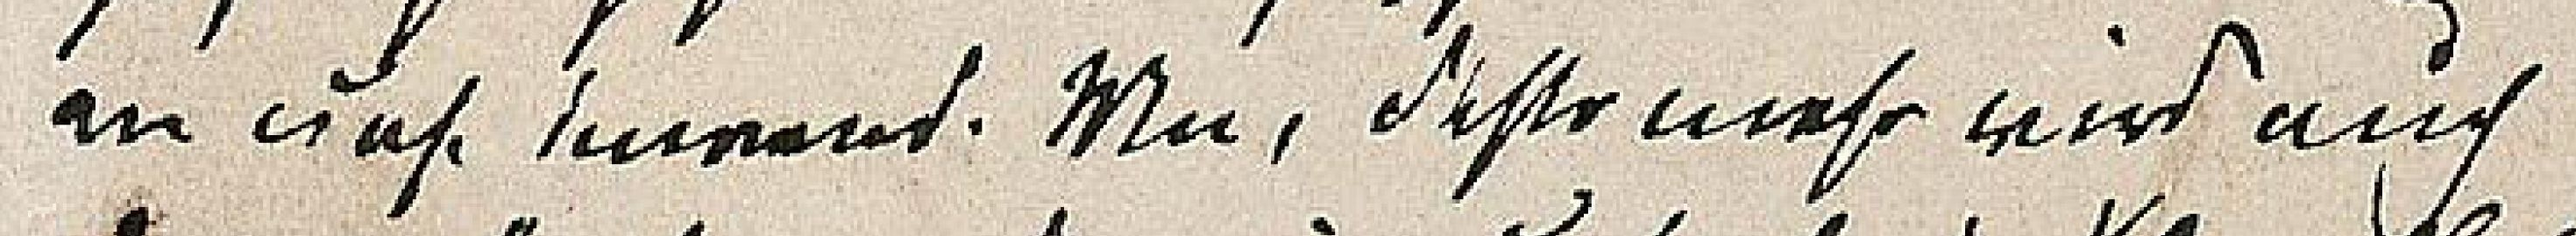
an uns. inwend. Mn, desto mehr wird auch
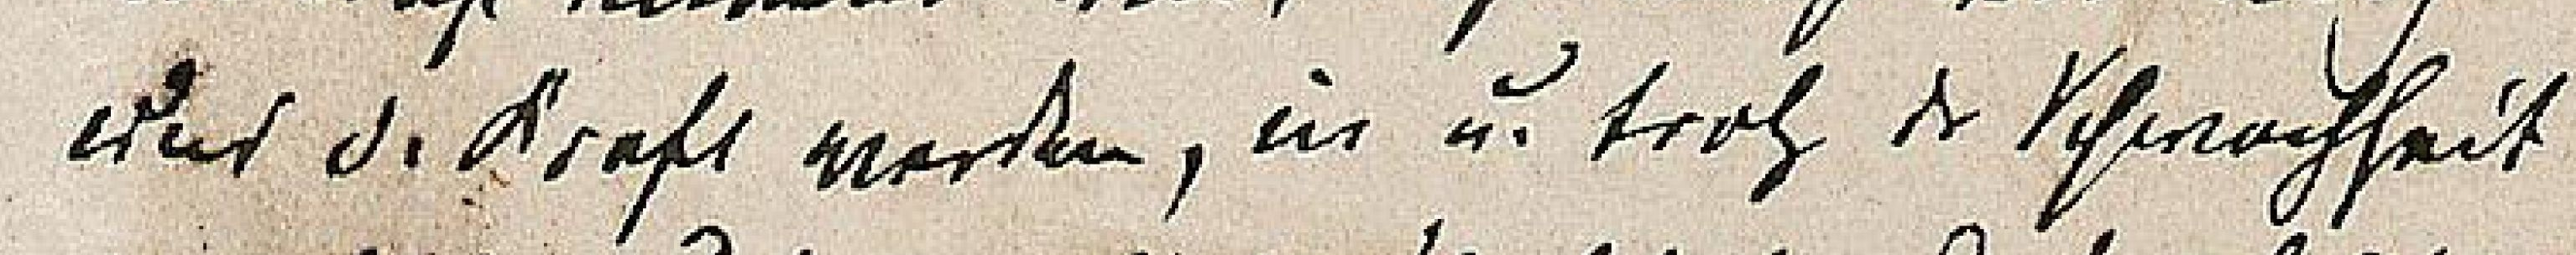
uns d. Kraft werden, in u trotz der Schwachheit
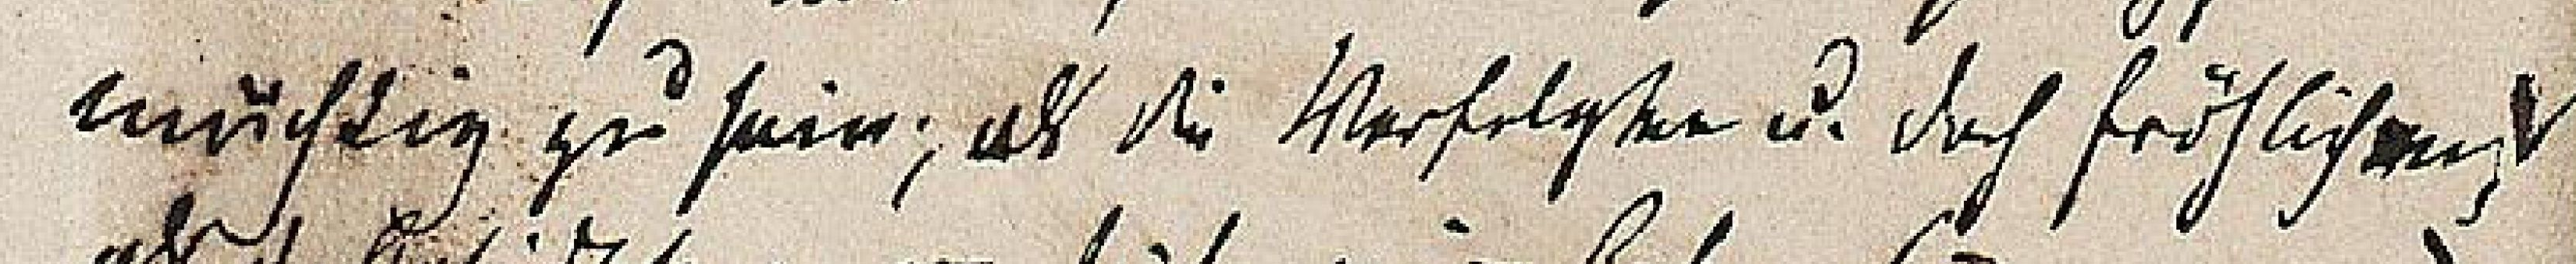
mächtig zu sein, als die Verfolgten u doch fröhlichen
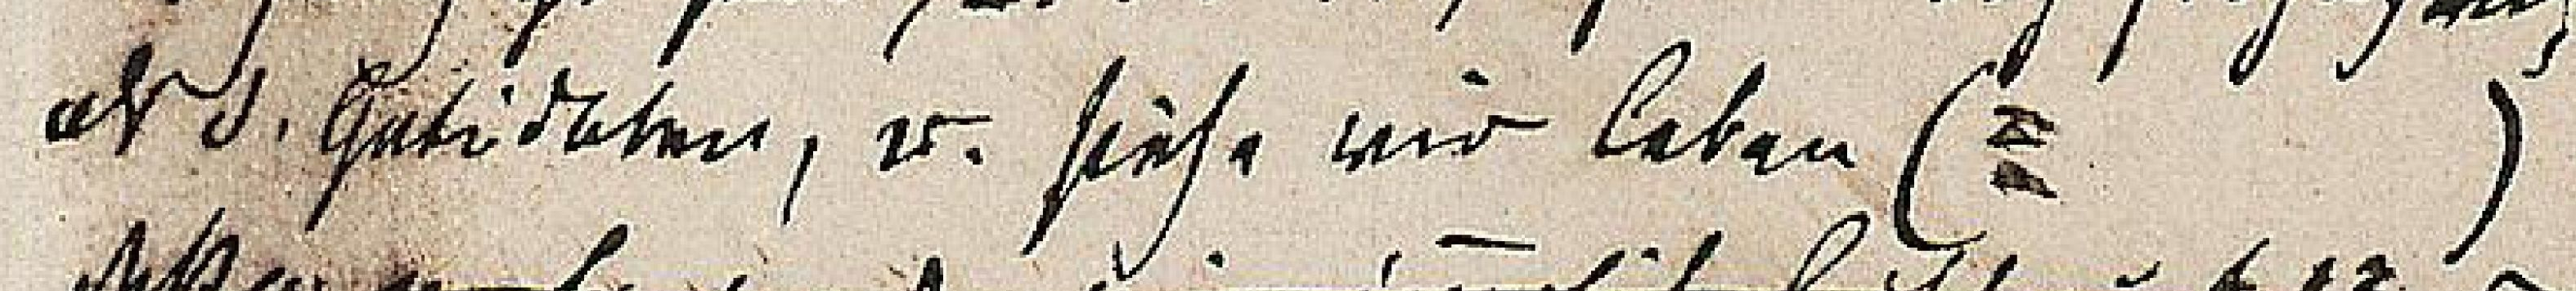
als d Getödeten, u. siehe wir leben (?)
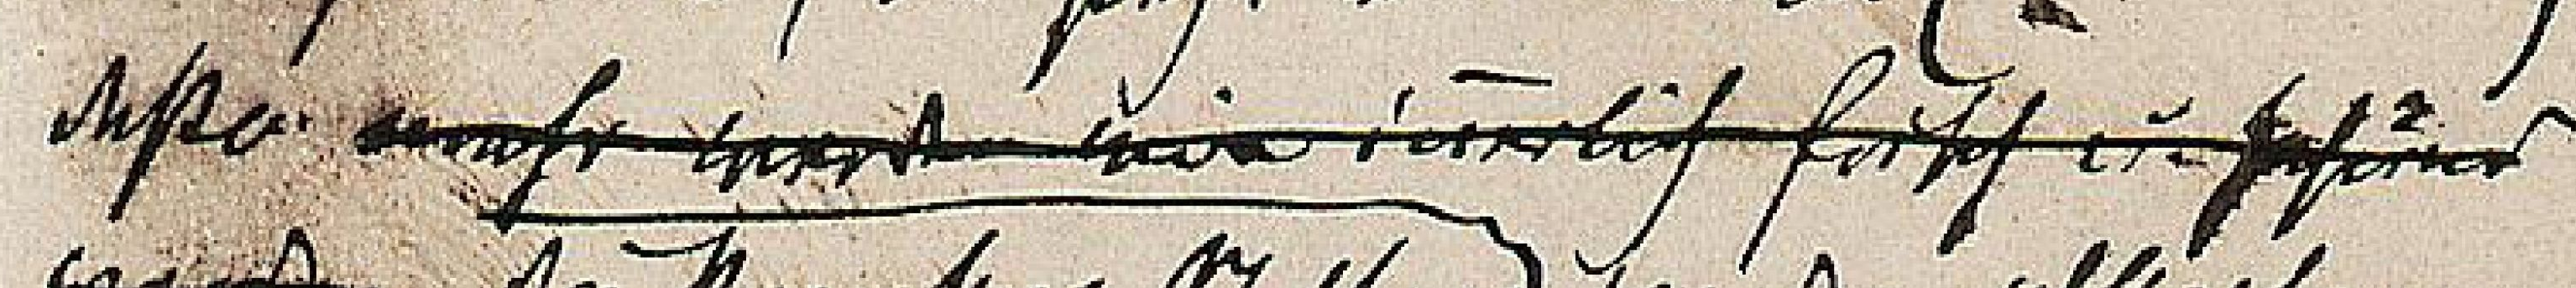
desto mehr wierden wir innerlich frisch un schöner
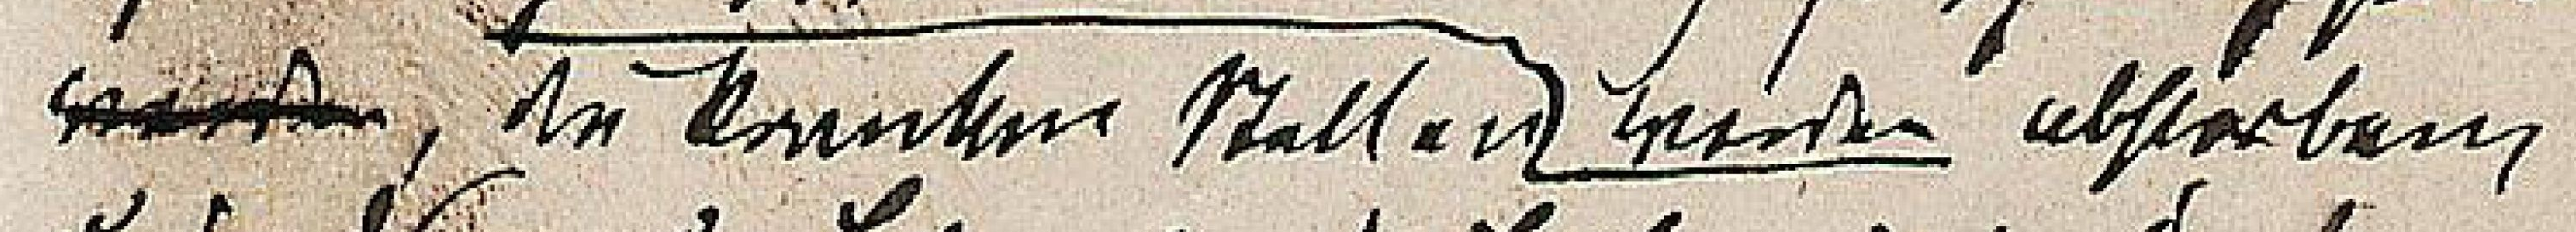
werden, die kranken Stelle werden absterben,
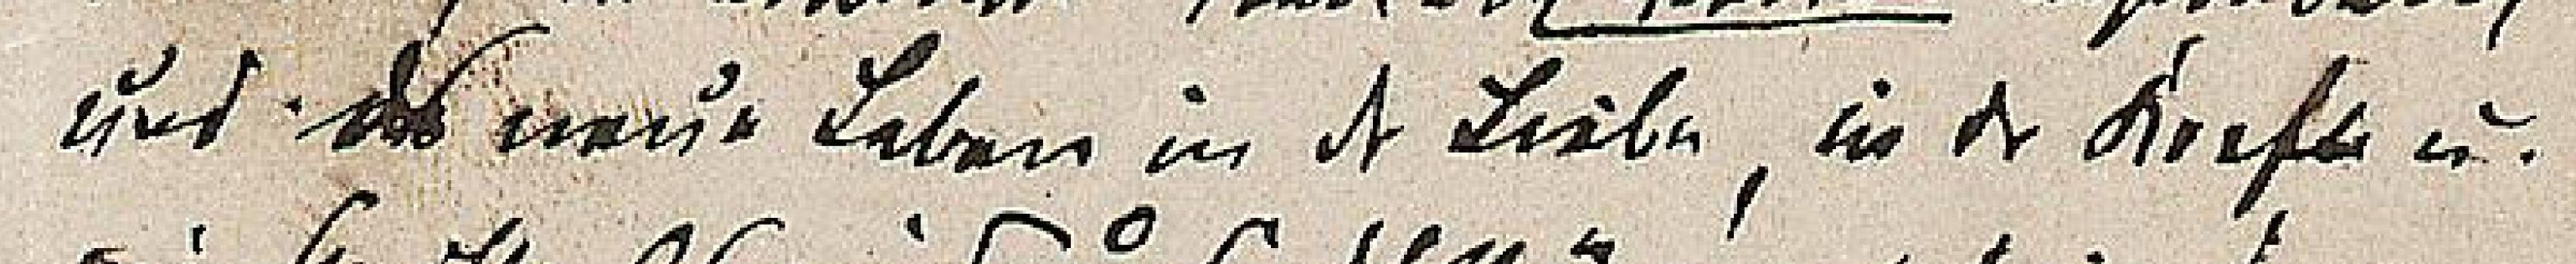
und das neue Leben in der Liebe, in der Kraft u.
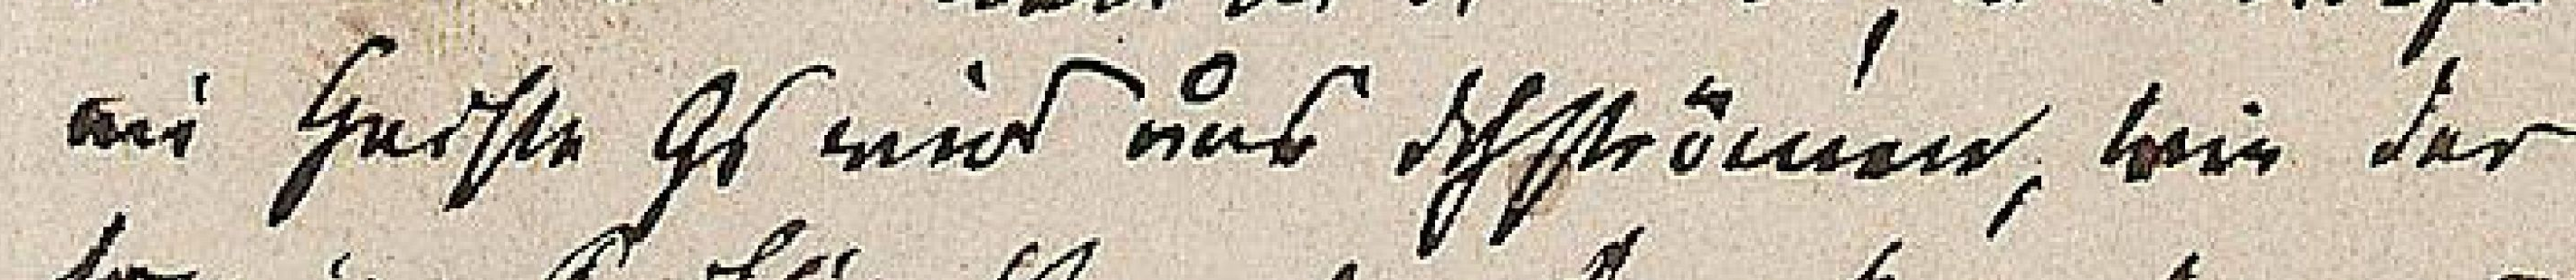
im Geiste Gs wird uns dchströmen, wie der
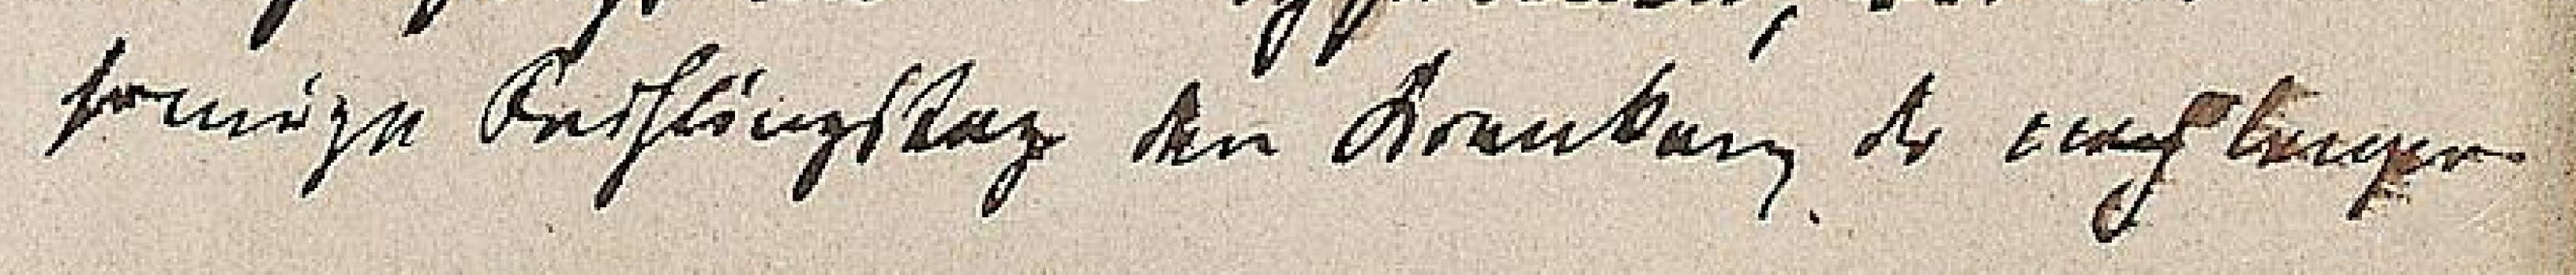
sonnige Frühlingstag den Kranken, der nach langer
